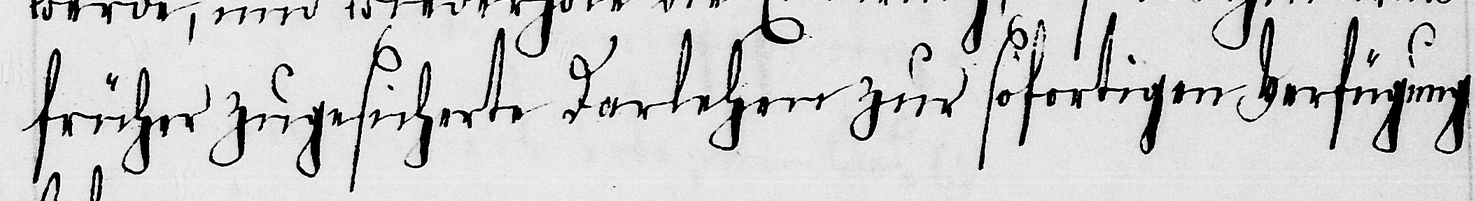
früher zugesicherte Darlehen zur sofortigen Verfügung
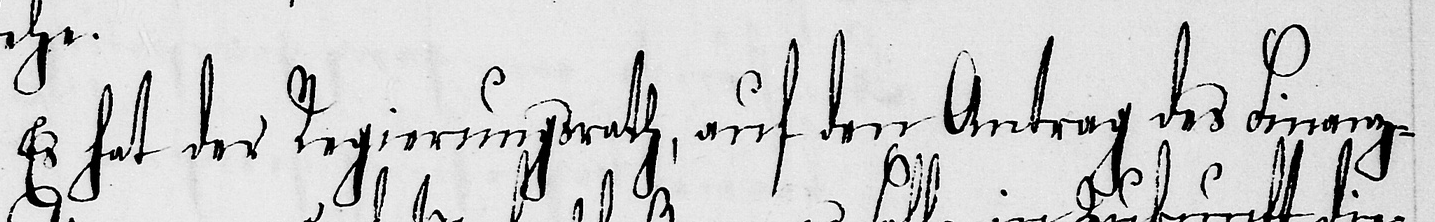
Es hat der Regierungsrath, auf den Antrag des Finanz¬
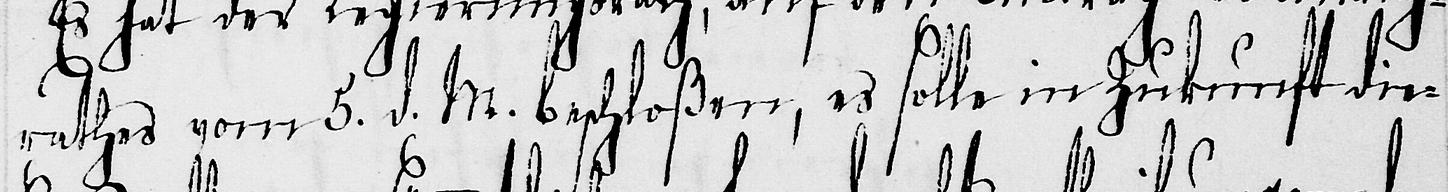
rathes vom 5. d. M. beschloßen, es solle in Zukunft die¬
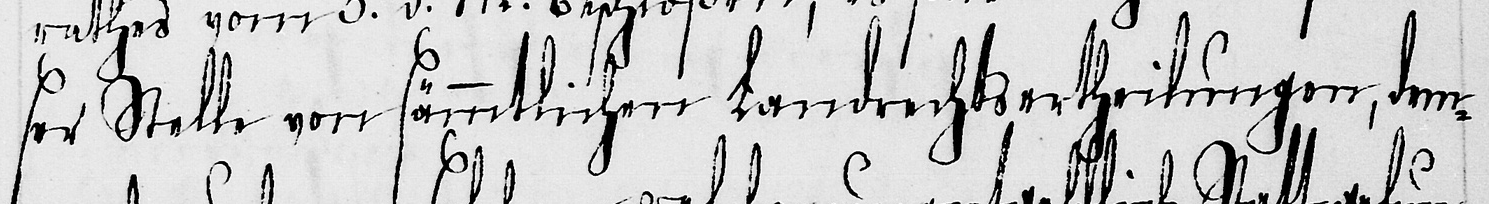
ser Stelle von sämmtlichen Landrechtsertheilungen, dem¬
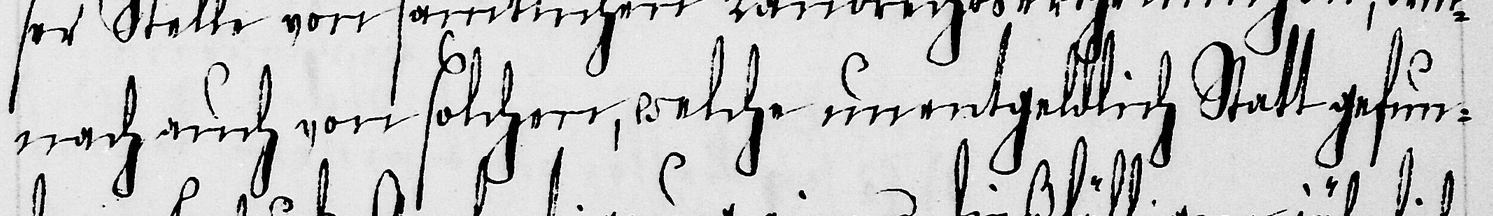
nach auch von solchen, welche unentgeldlich Statt gefun¬
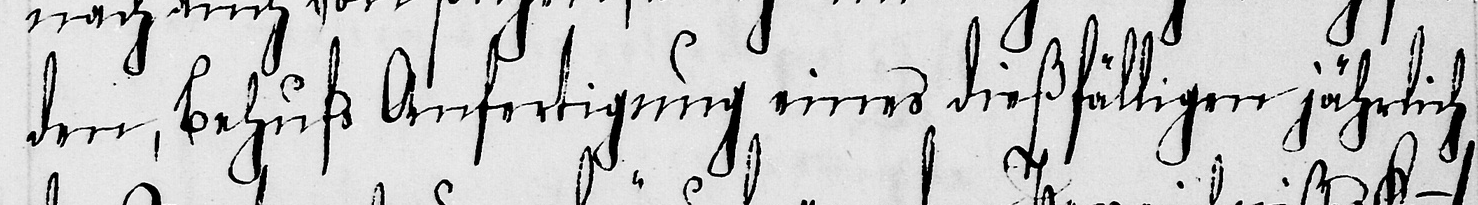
den, Behufs Anfertigung eines dießfälligen jährlich
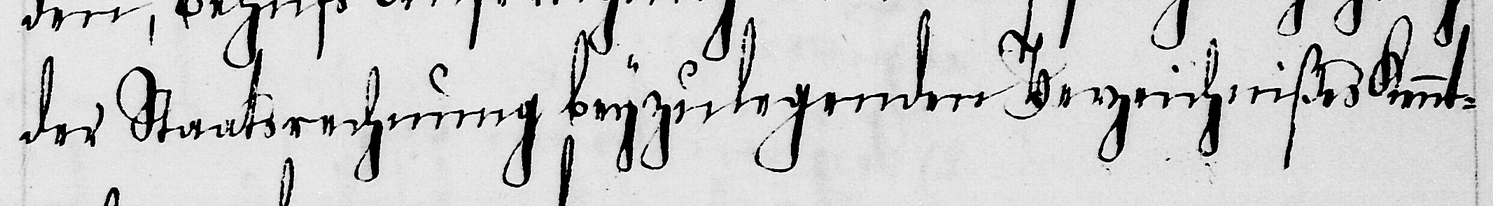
der Staatsrechnung beyzulegenden Verzeichnißes Kennt¬
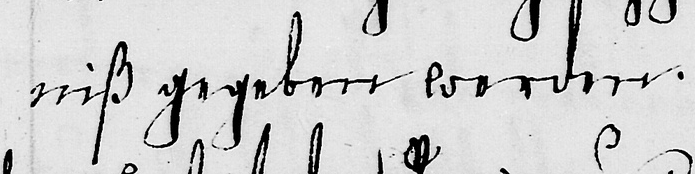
niß gegeben werden.
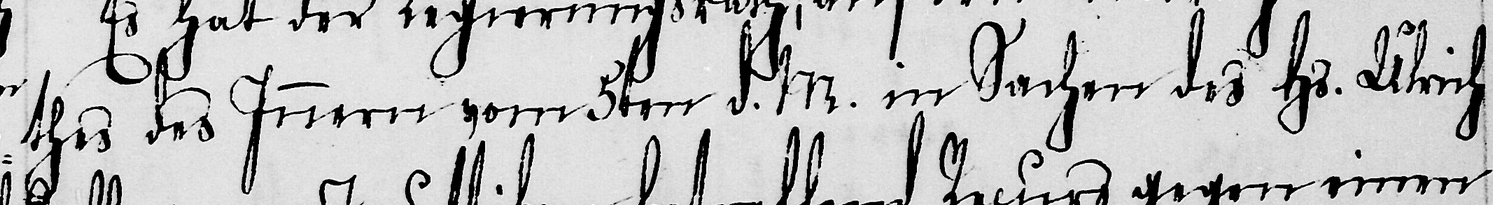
thes des Innern vom 5ten d. M. in Sachen des Hs. Ulrich
